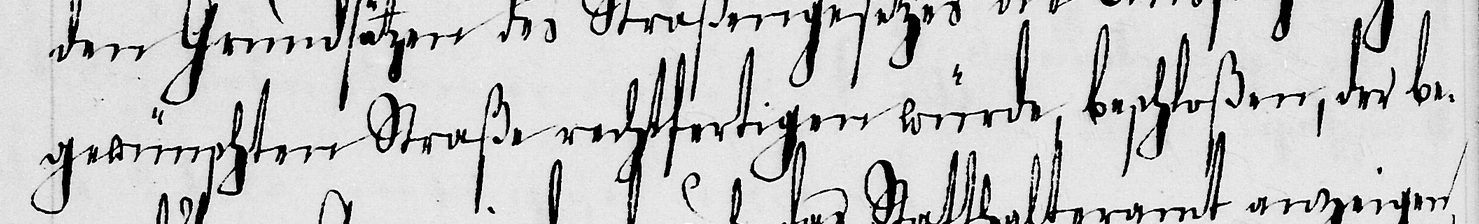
gewünschten Straße rechtfertigen würde, beschloßen, der be¬
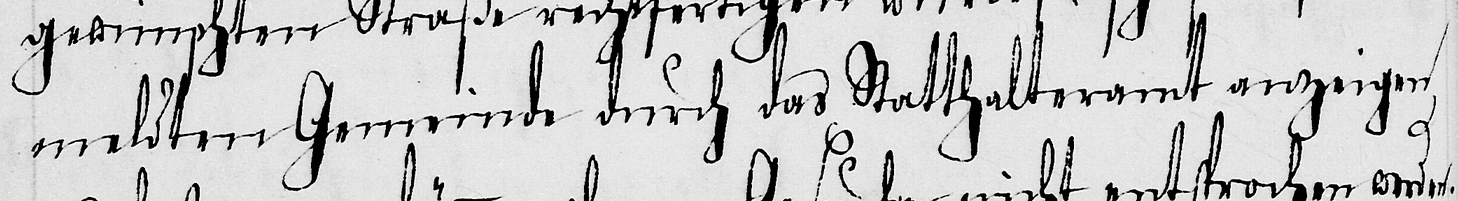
meldten Gemeinde durch das Statthalteramt anzeigen
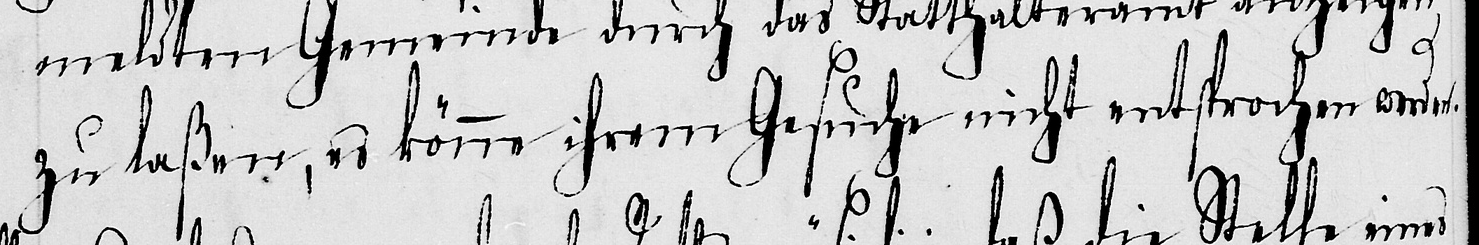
zu laßen, es könne ihrem Gesuche nicht entsprochen wer¬
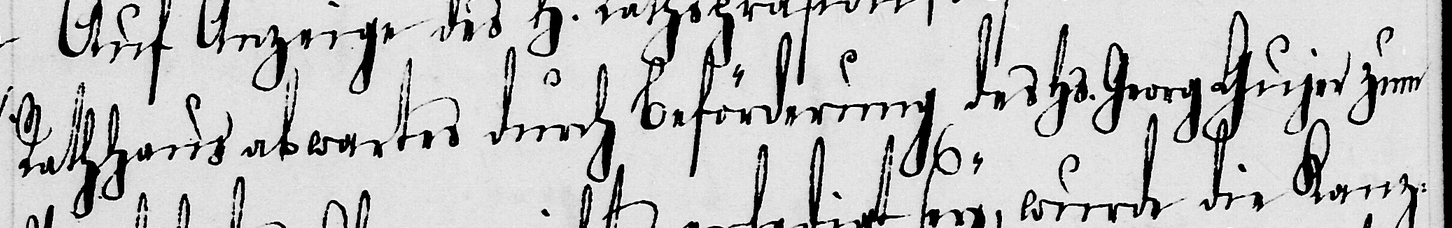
Rathhausabwartes durch Beförderung des Hs. Georg Gujer zum
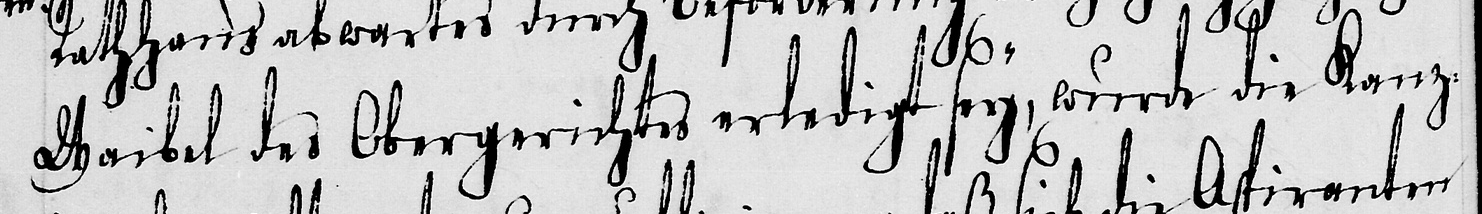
Waibel des Obergerichtes erledigt sey, wurde die Kanz¬
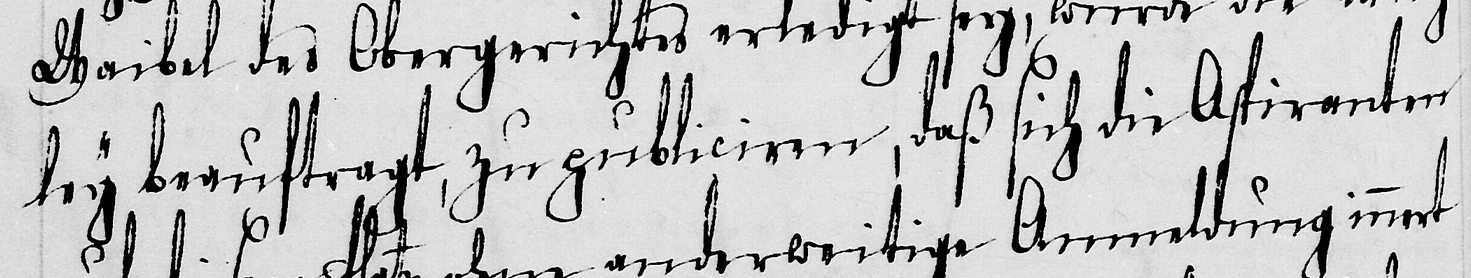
ley beauftragt, zu publiciren, daß sich die Aspiranten
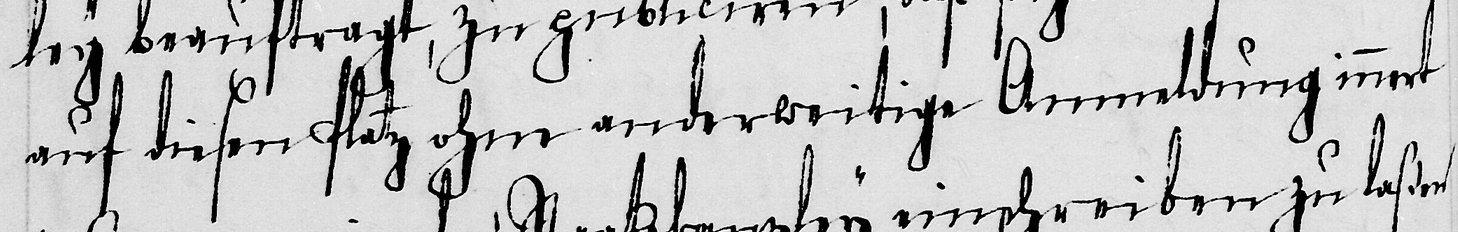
auf diesen Platz ohne anderweitige Anmeldung inne¬
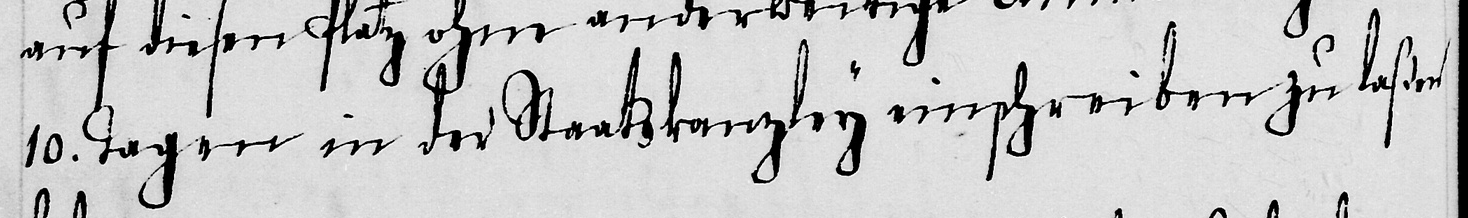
10. Tagen in der Staatskanzley einschreiben zu laßen
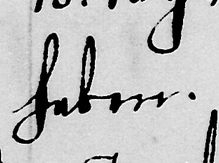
haben.
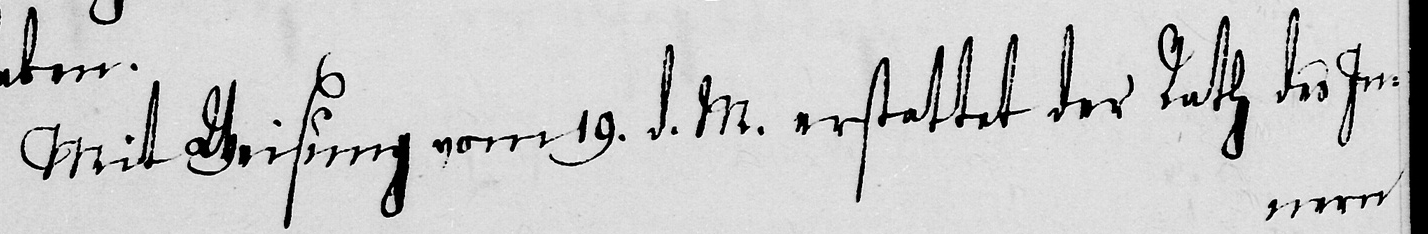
Mit Weisung vom 19. d. M. erstattet der Rath des In-
